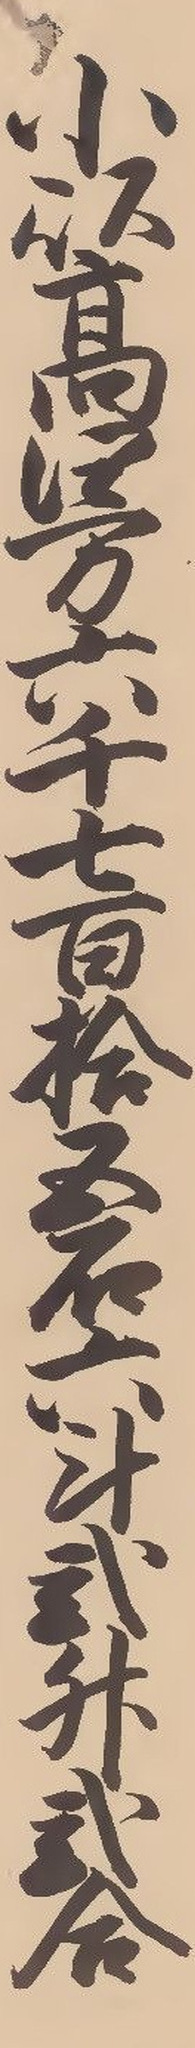小以髙四万六千七百拾五石六斗弐升弐合
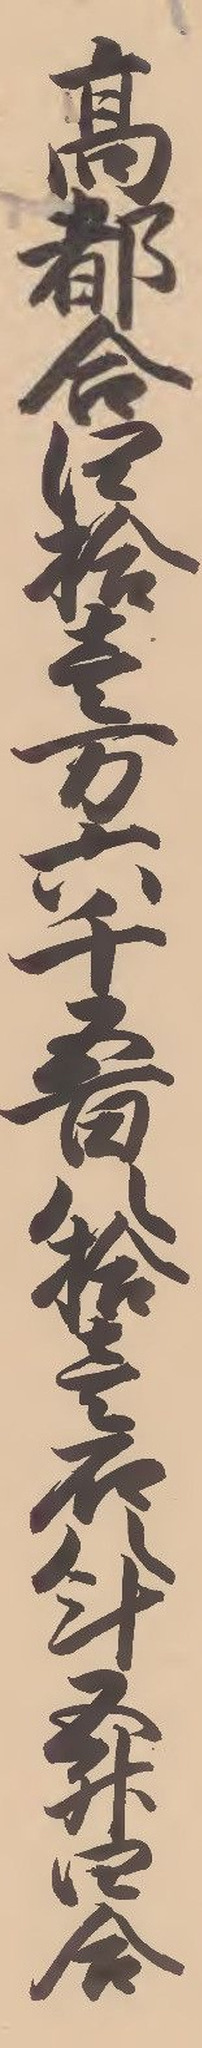都合四拾壱万六千五百八拾壱石八斗五升四合

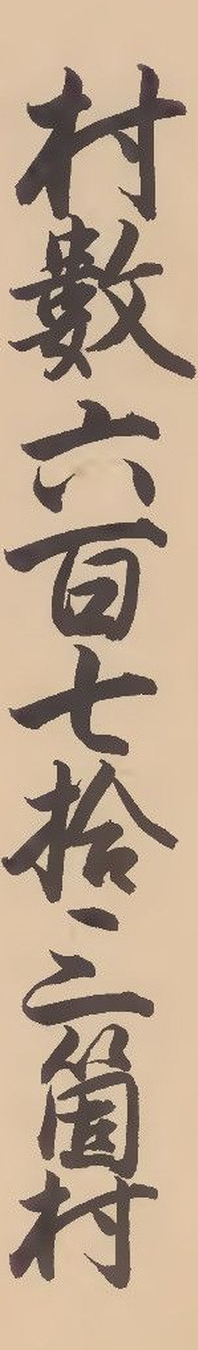村數六百七拾三箇村
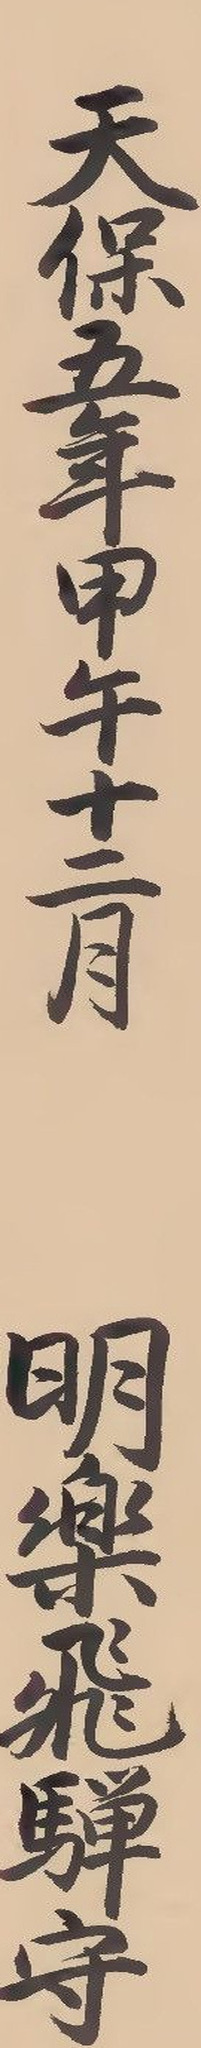天保五年甲午十二月明樂飛弾守
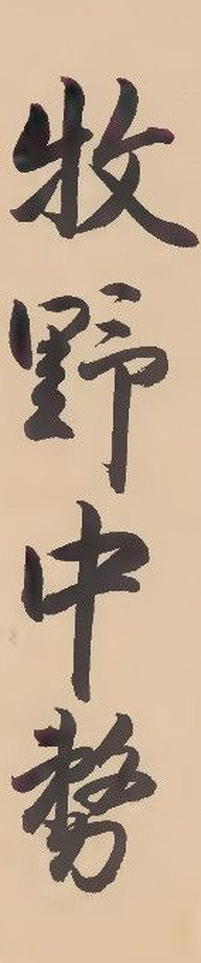牧野中務
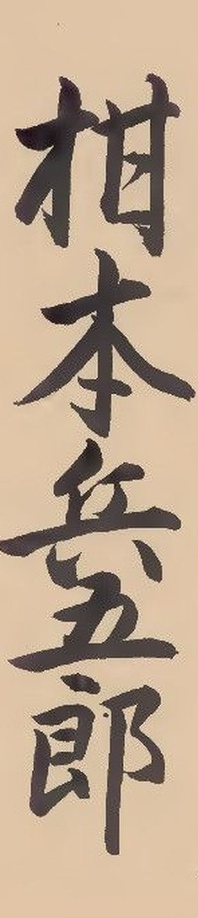柑本兵五郎
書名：備前国郷帳
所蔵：国立公文書館 National Archives of Japan
